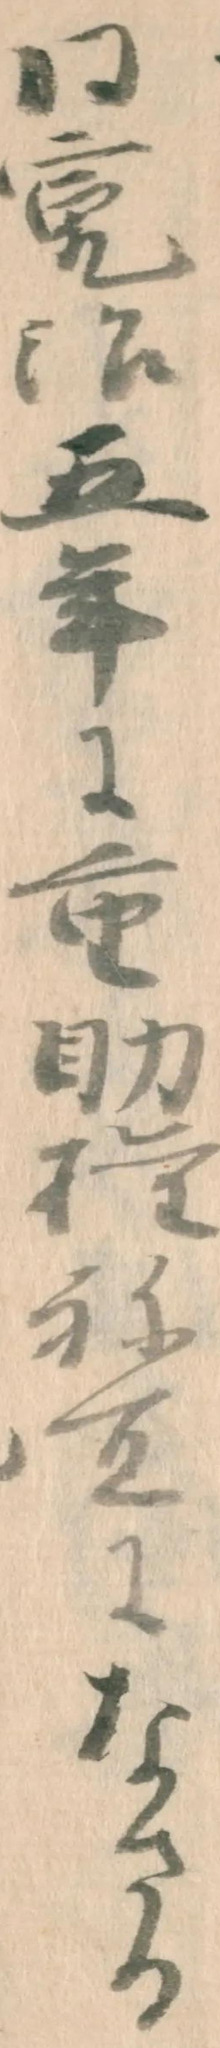同寛治五年に重助権祢宜になさる
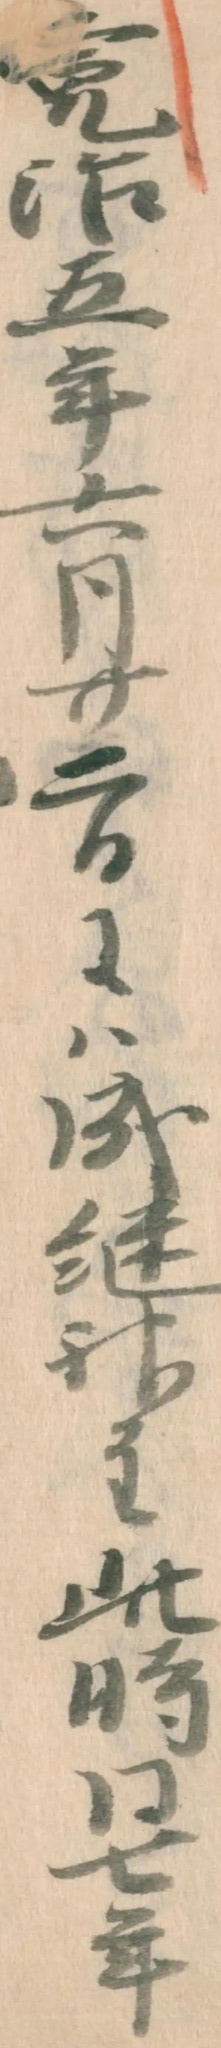寛治五年六月廿二日には成継神主此時同七年
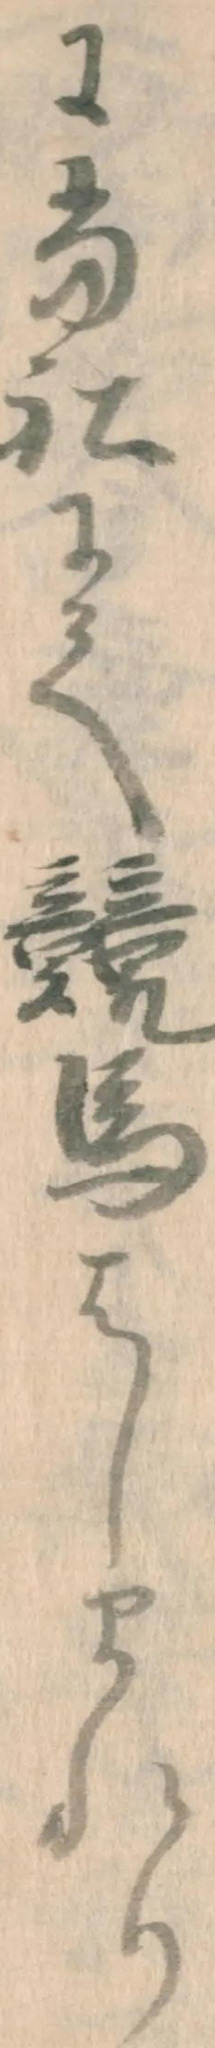に当社にて競馬はしまれり
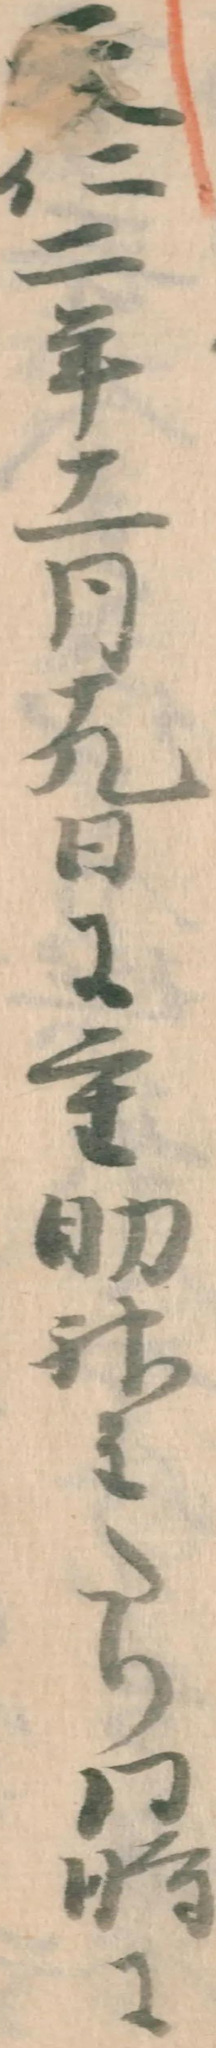天仁二年十一月十九日に重助神主たり同時に
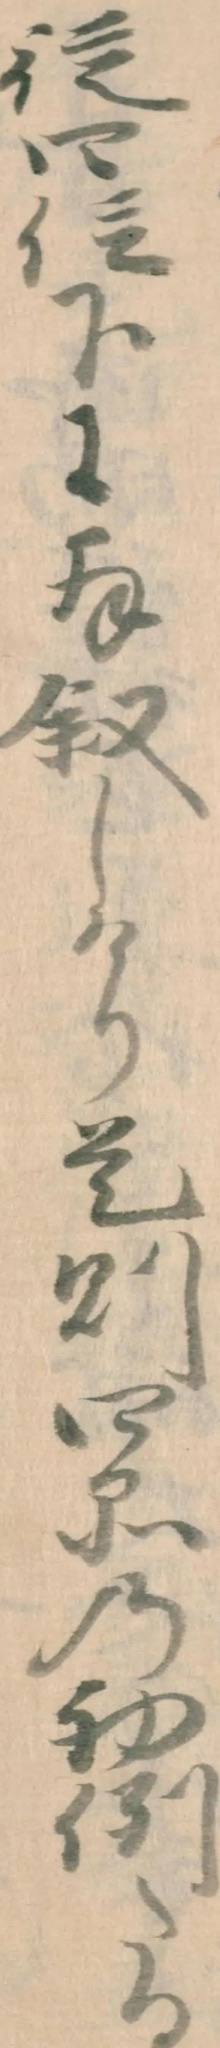従四位下に拝叙しけり是則四品の初例たる
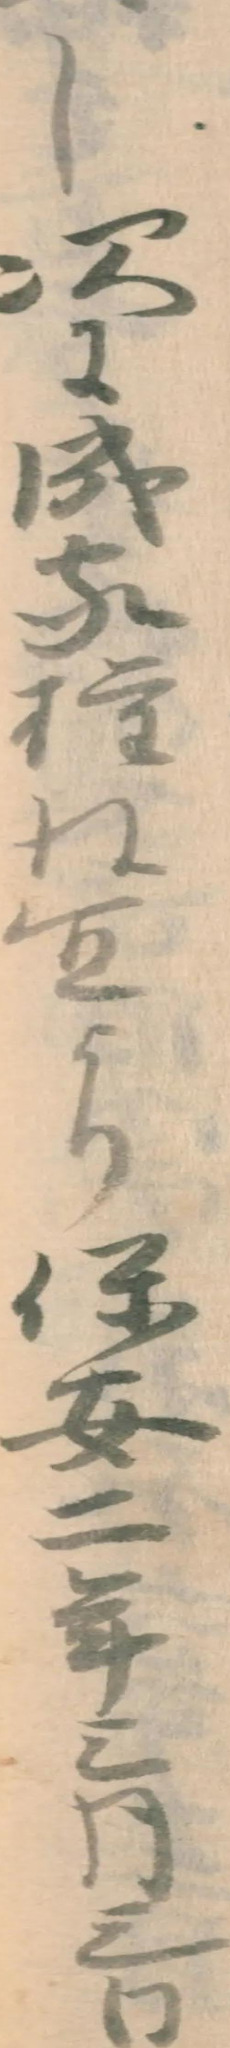へし次に成家権ね宜より保安二年三月三日
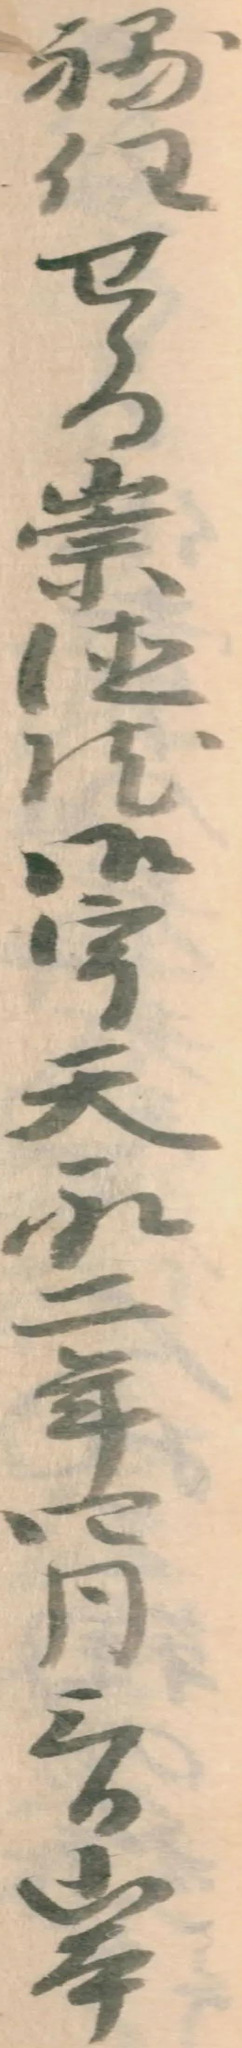補任せらる祟徳院御宇天承二年四月三日山本
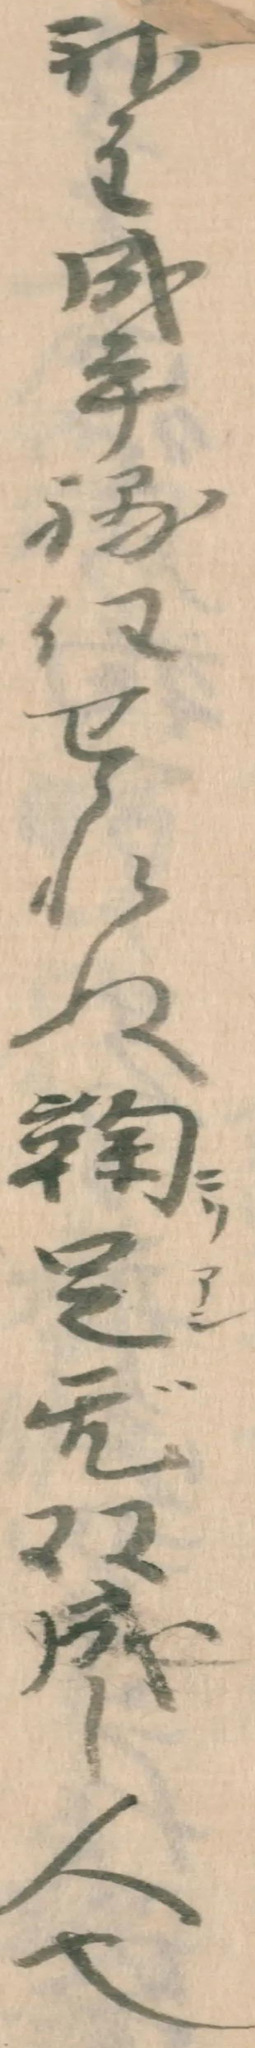神主成平補任せられぬ鞠足无双成し人也
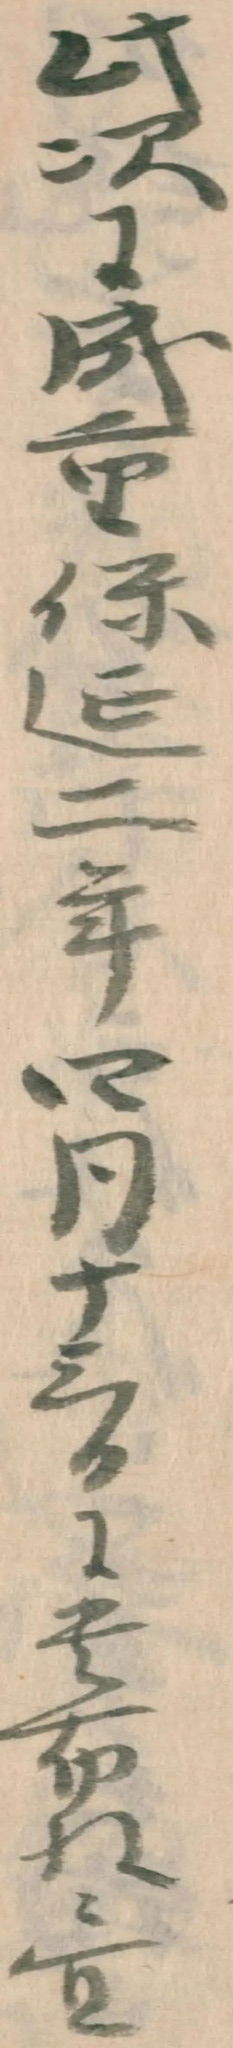此次に成重保延二年四月十三日に貴ふねゝ宜
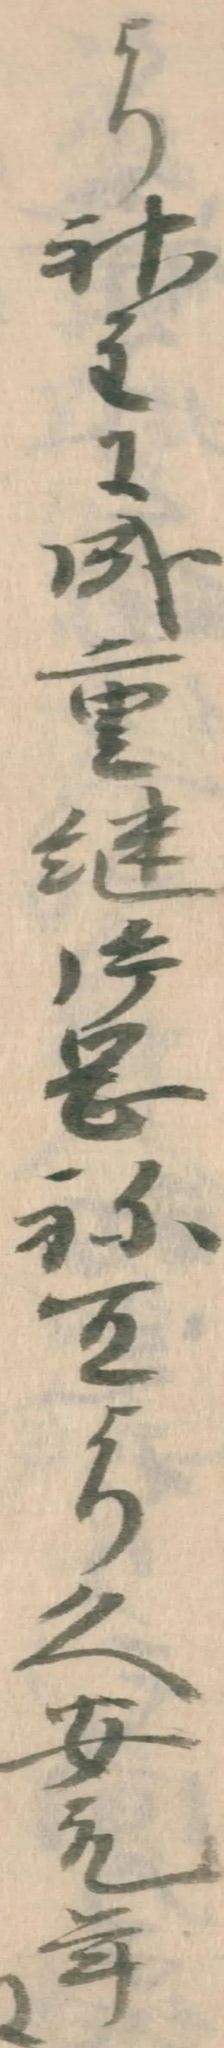より神主に成重継片岡祢宜より久安元年に
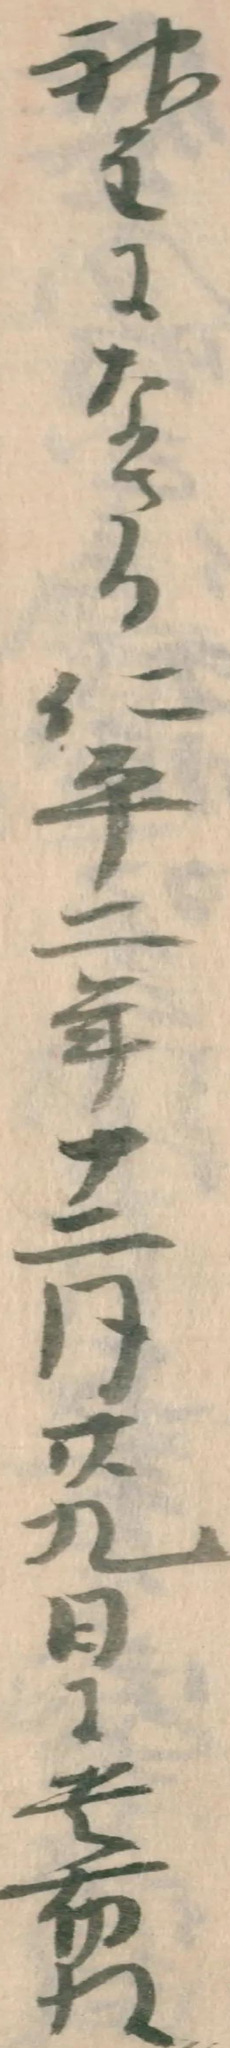神主になさる仁平二年十二月廿九日に貴ふね
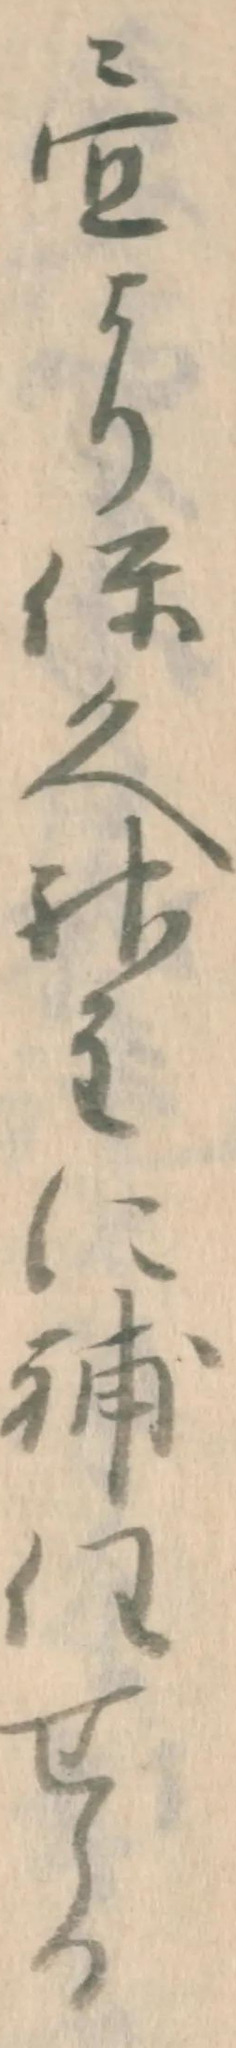ゝ宜より保久神主に補任せらる
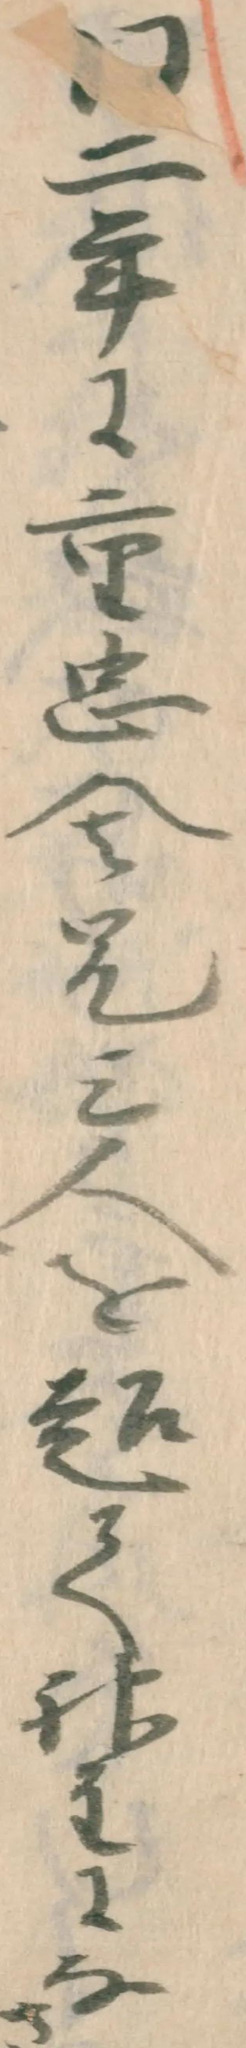同二年に重忠舎兄三人を超て神主になさる
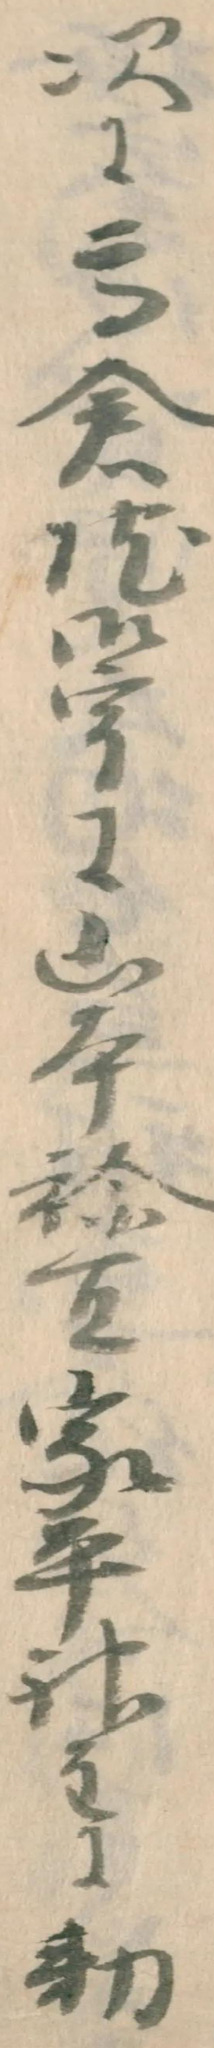次に高倉院御宇に山本祢宜家平神主に勅
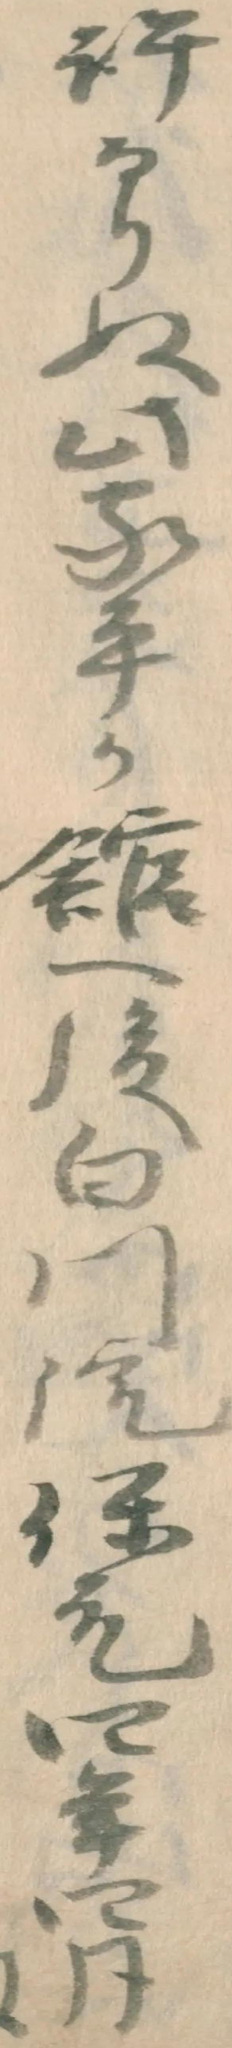許なりぬ此家平か館へ後白川院保元四年四月に
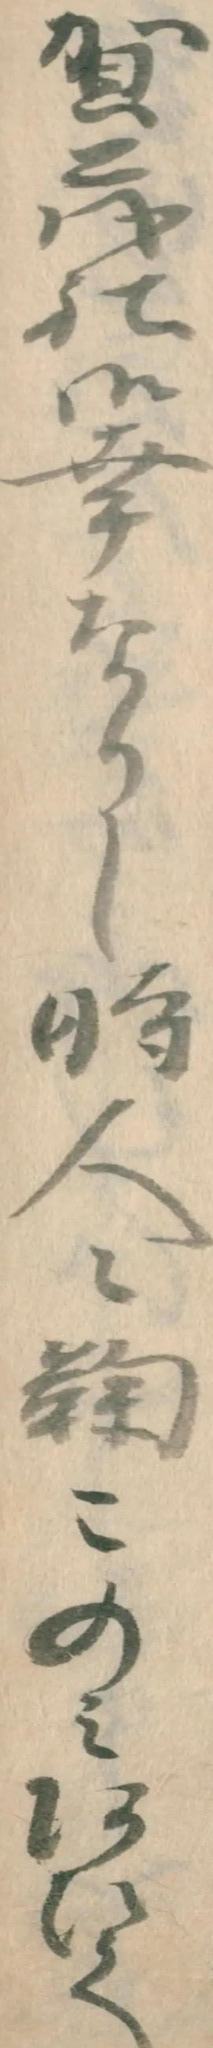賀茂社御幸なりし時人々鞠このみあひて
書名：賀茂社記録. 第1冊
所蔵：国立国会図書館 National Diet Library, JAPAN
